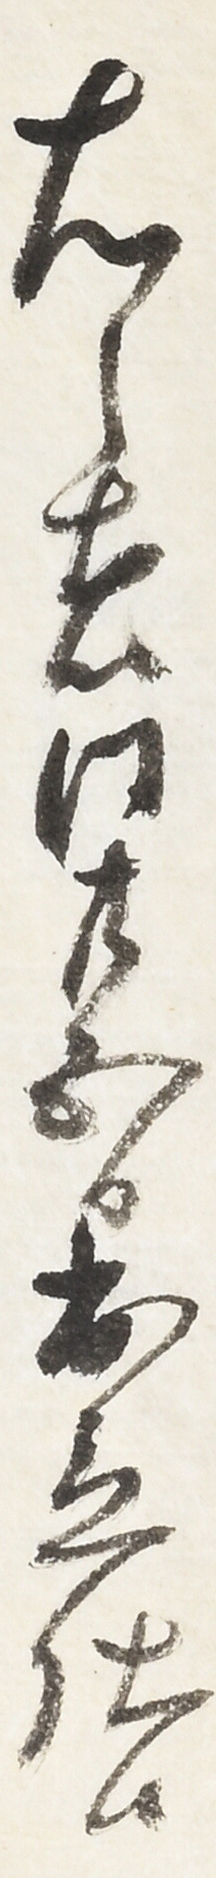右之者同廿五日出立仕候
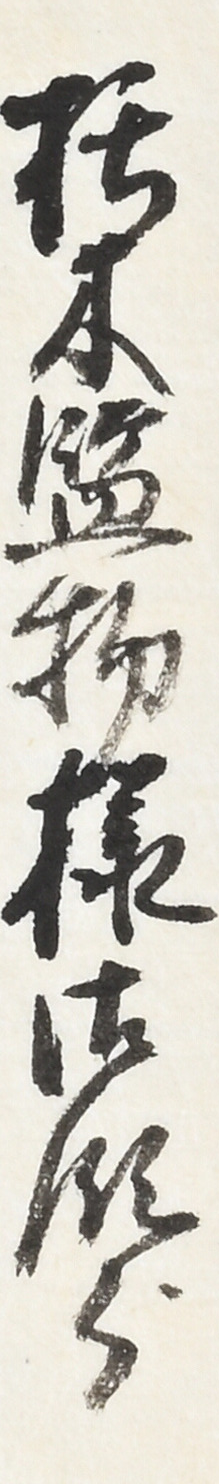朽木監物様御領分
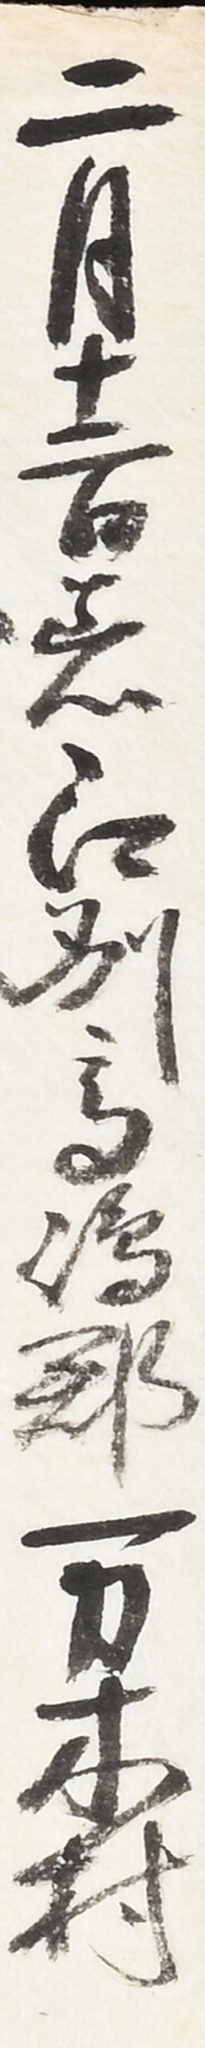二月十二日着江州高嶋郡万木村
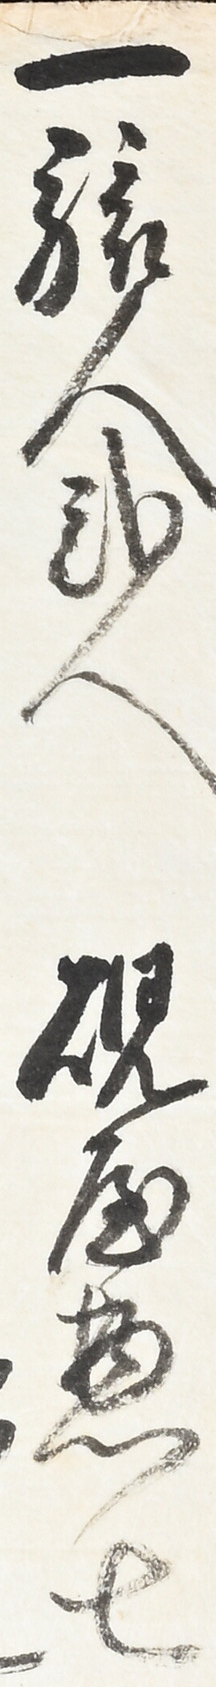一旅人弐人硯屋惣七
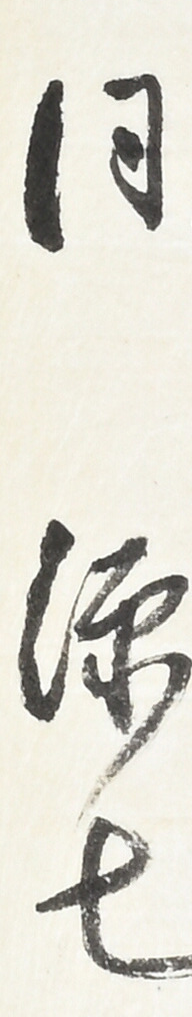同源七
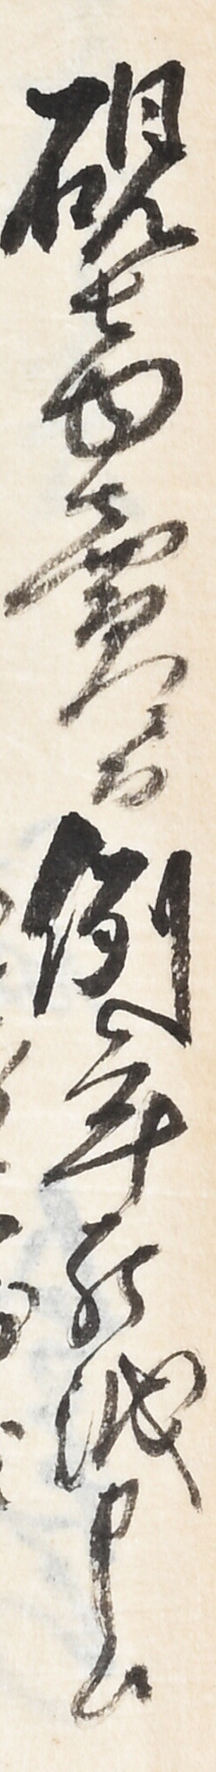太物商売ニ而例年罷越申候
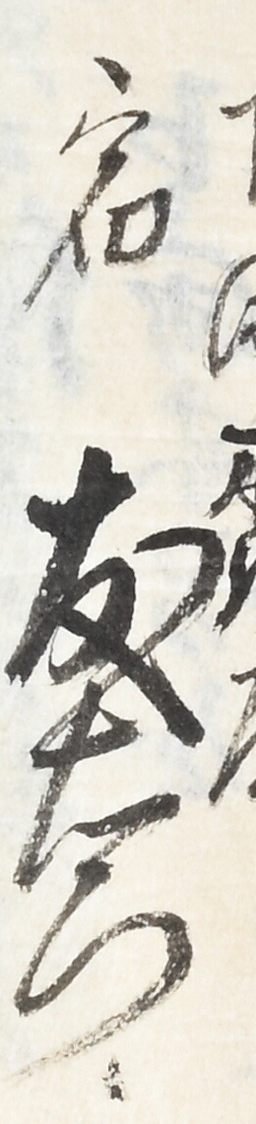宿吉左衛門
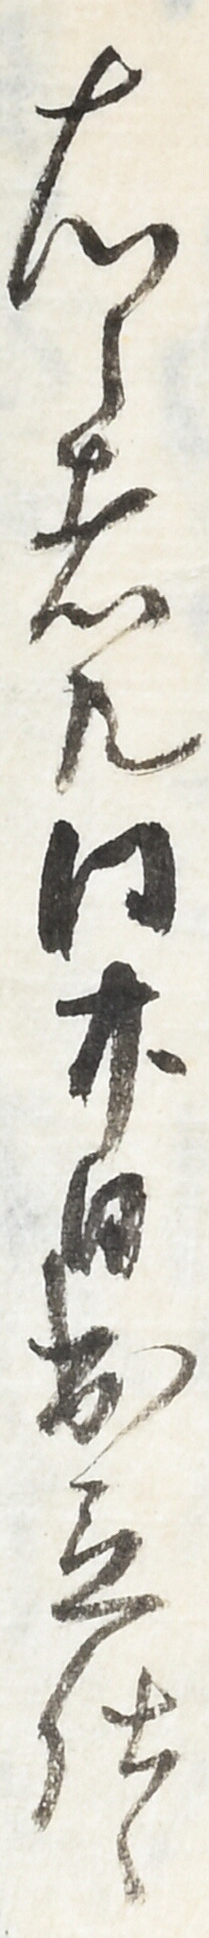右之者同廿日出立仕候

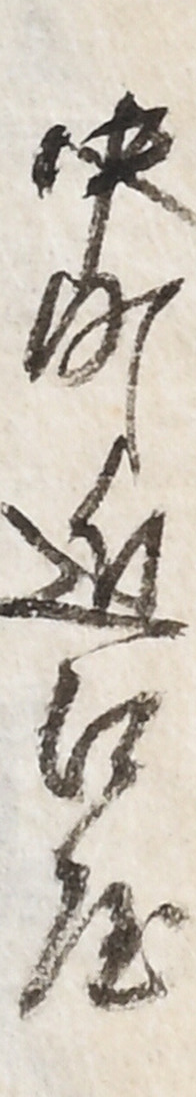中町近江屋
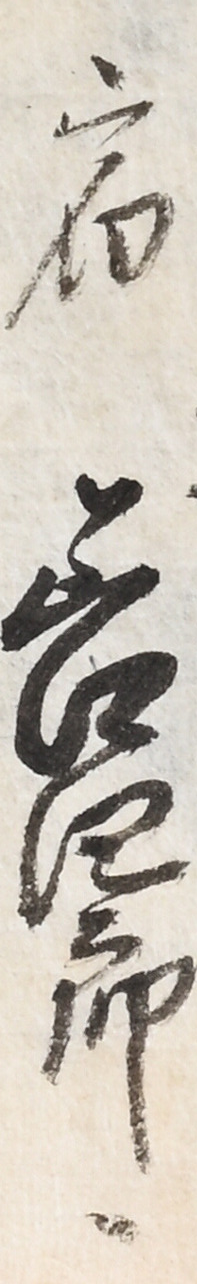宿善四郎
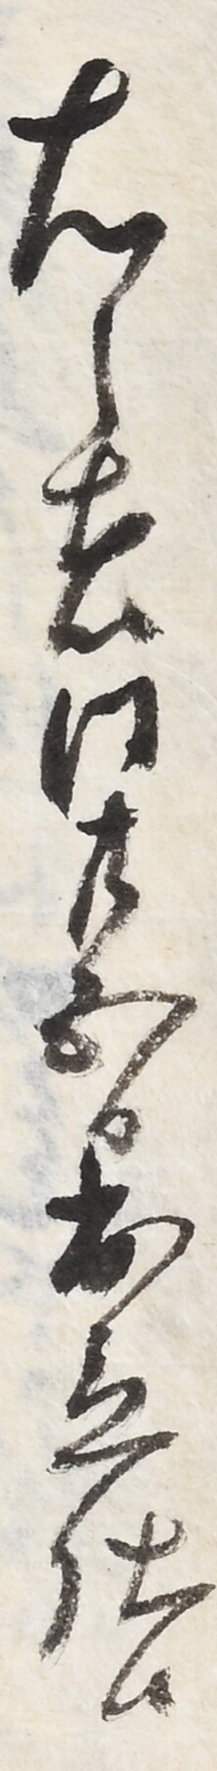右之者共同廿ク日出立仕候
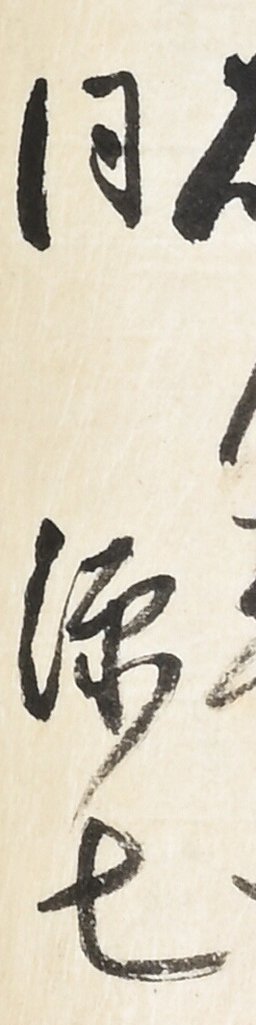同源八
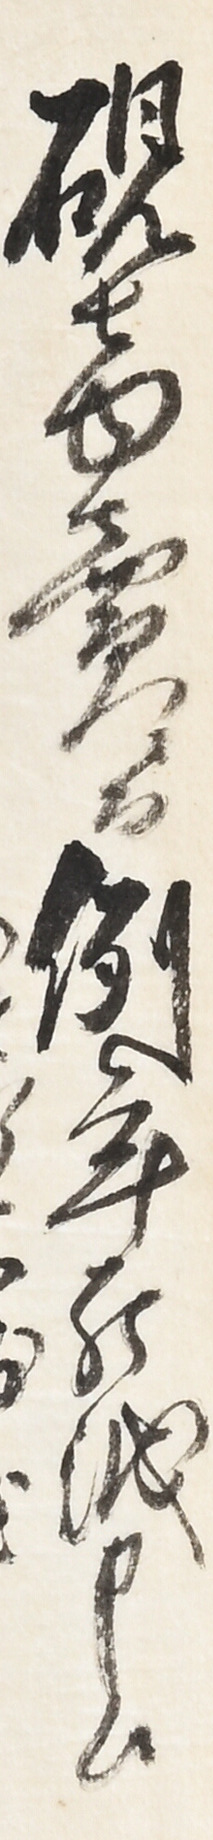硯商売ニ而例年罷越申候
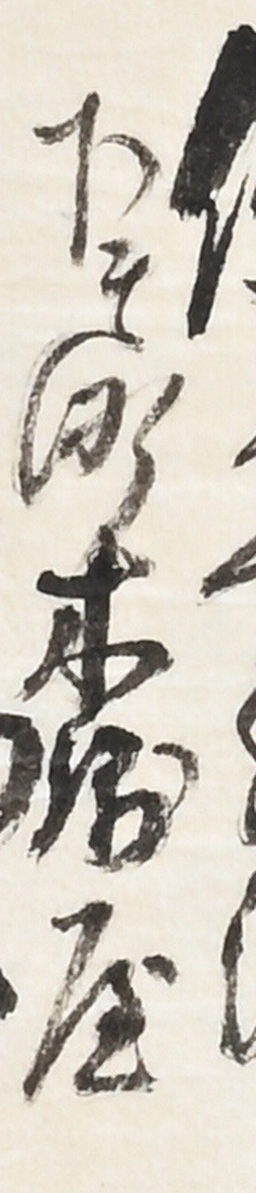下モ町木曽屋
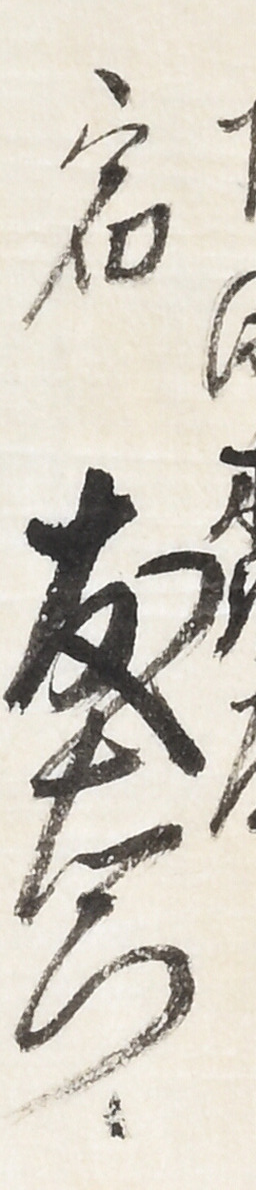宿友右衛門・
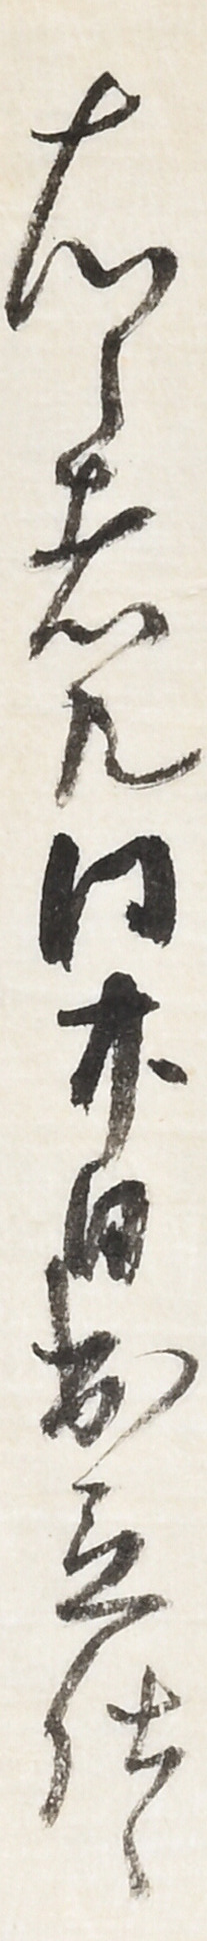右之者共同廿日出立仕候
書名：旅人泊控帳
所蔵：伊那市立高遠町図書館・合同会社AMANE
